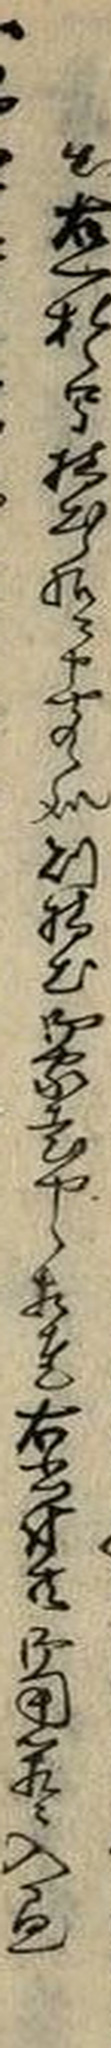出右一札之写指出候様ニ申聞候処則指出御家老中へ相達右書付共御用箱ニ入置
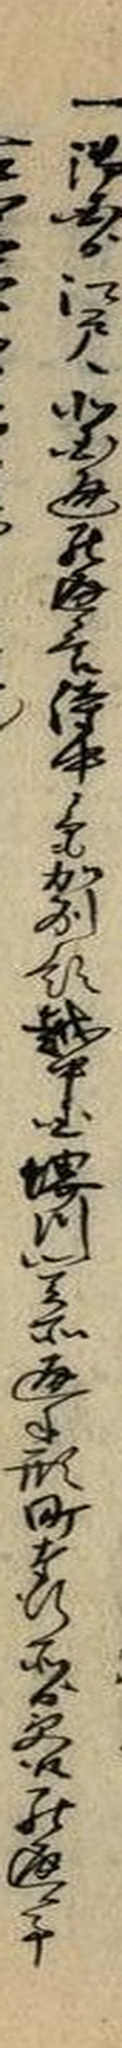一御国ゟ江戸へ北国通罷通候節侍中ニ而も加州領越中国堺川関所通手形町奉行所ゟ受取罷通候事
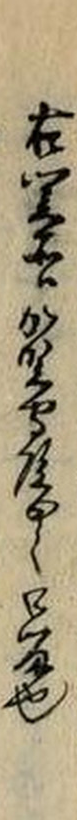右関所ハ加賀守殿ゟ之口留也
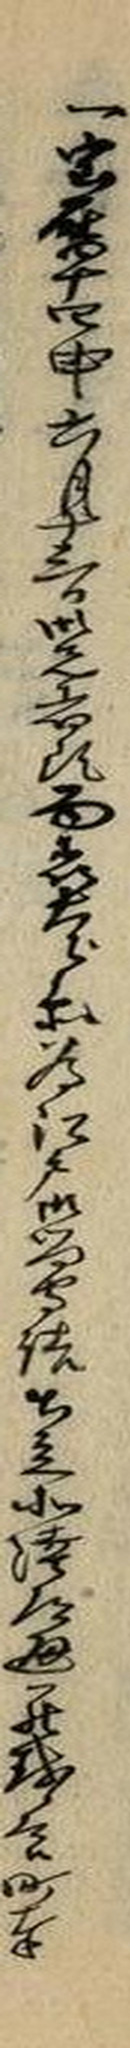一宝暦十四申六月十三日御先者頭雨森太郎兵衛為江戸御留守詰出立北陸道通罷越候節町奉
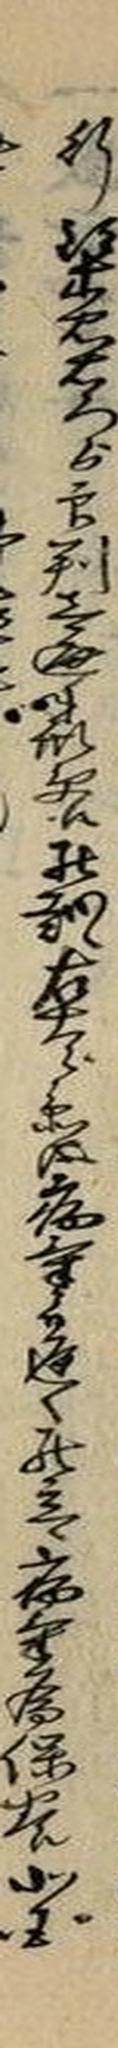行鈴木忠右衛門ゟ印判壱通手形受取罷越候右太郎兵衛儀病気ニ付遅く罷立候病気為保養北国
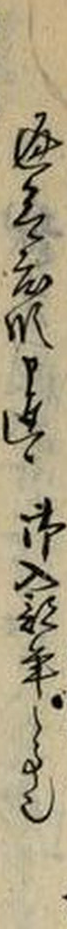通参度段申達候御入部年之事也
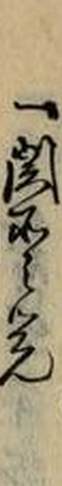一関所之覚
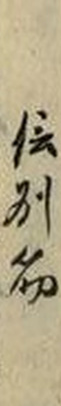奥州筋
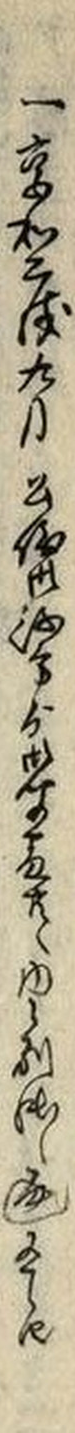一享和二戌九月公儀御役方ゟ御聞番共へ内々別紙之通有之由
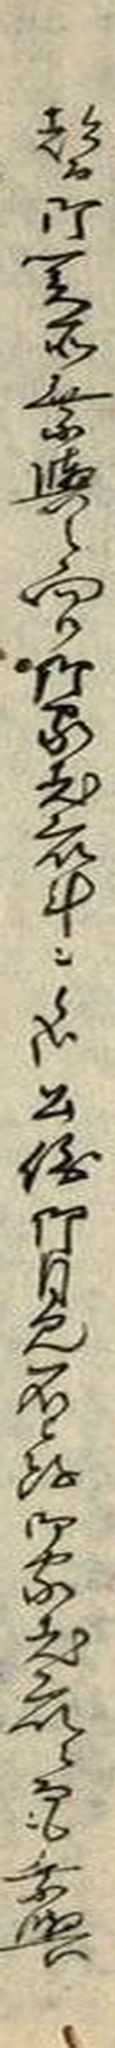都而御関所乗輿之向ハ御家老衆斗ニ候哉公儀御目見不被致御家老衆ニ而も乗輿
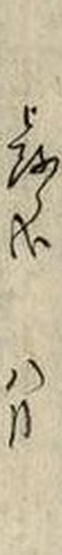被致候哉八月
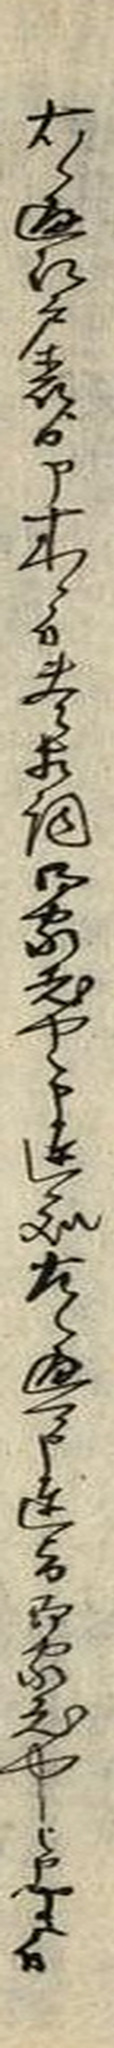右之通江戸表ゟ申来候ニ付夫々相伺御家老中へ申達候処左之通可申達旨御家老中被申聞候ニ付
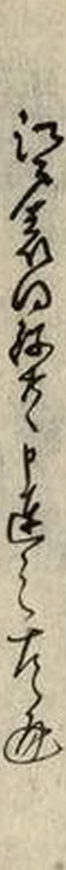江戸表同役共へ申達之左之通
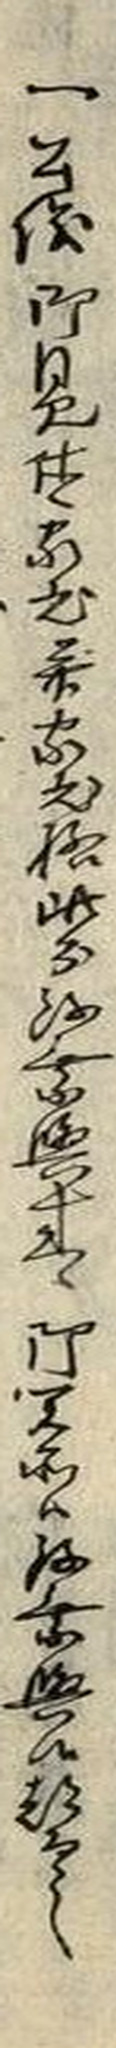一公儀御目見仕候家老幷家老格此分致乗輿来候御関所ハ致乗輿候都而之
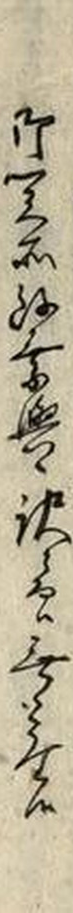御関所致乗輿候訳ニ而ハ無御座候
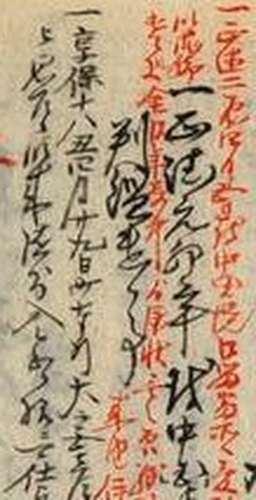判鑑遣候事
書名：御国他国諸事之部
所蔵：福井県文書館 Fukui Prefectural Archives
